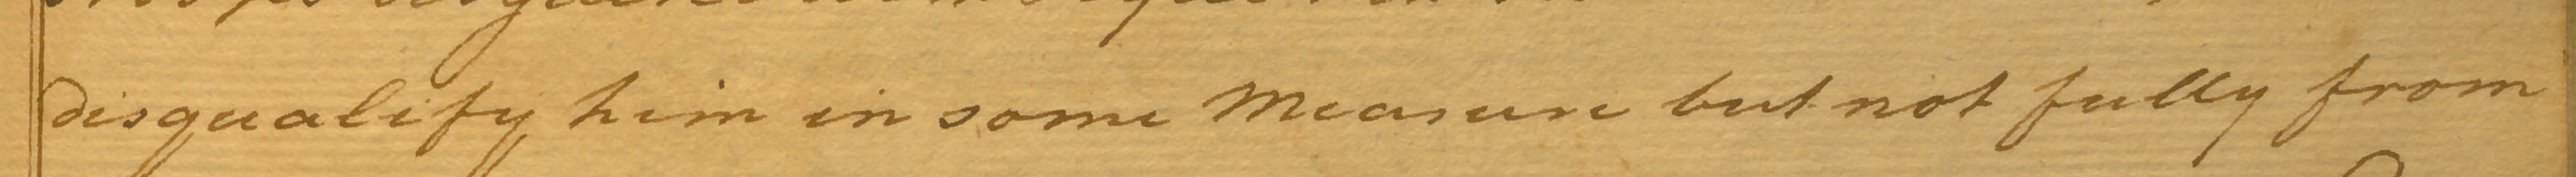disqualify him in some Measure but not fully from
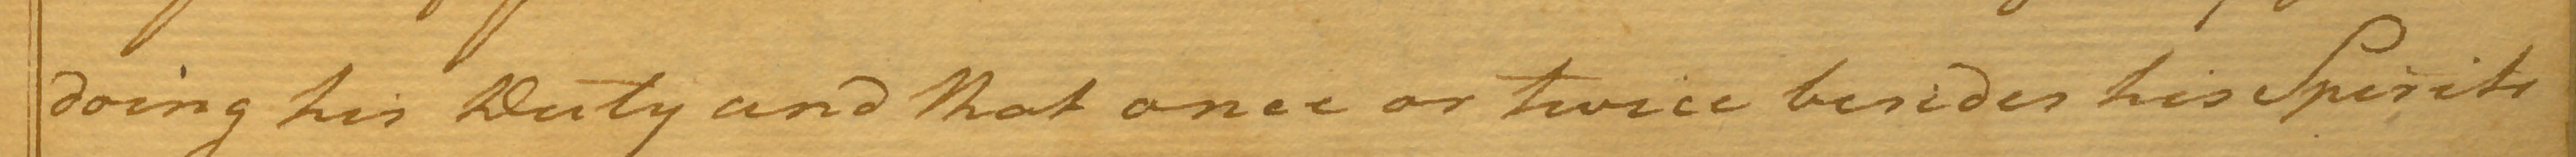doing his Duty and that once or twice besides his Spirits
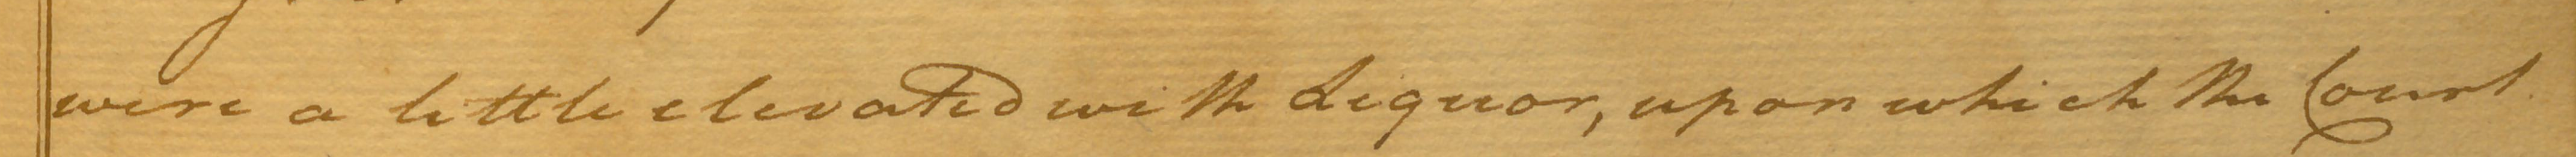were a little elevated with Liquor, upon which the Court
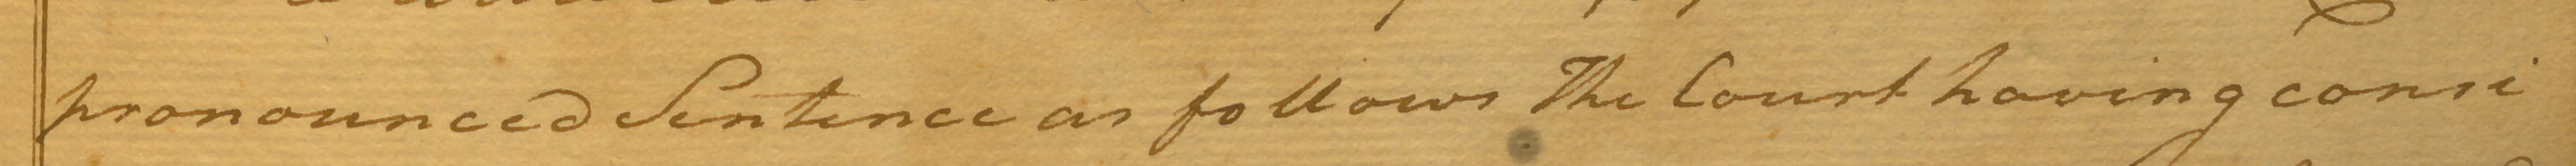pronounced Sentence as follows The Court having consi
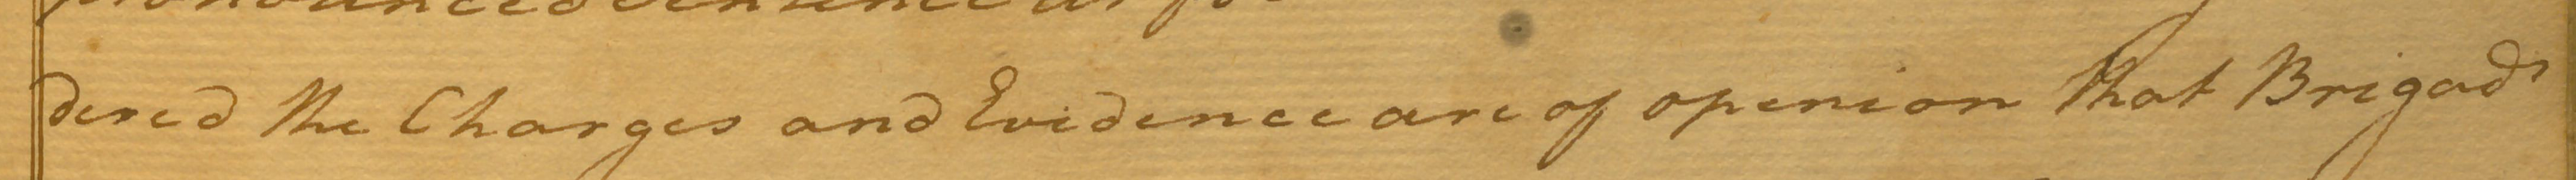dered the Charges and Evidence are of opinion that Brigad^r
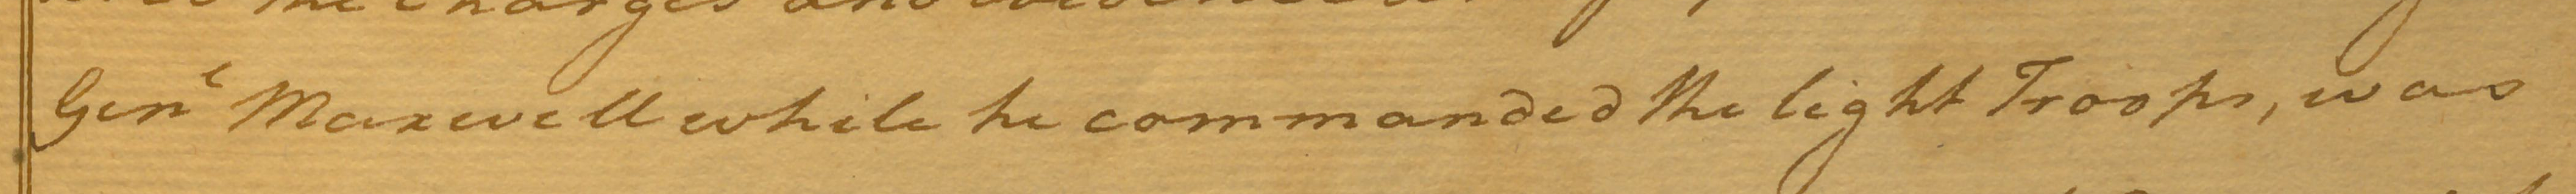Gen^l Maxwell which he commanded the light Troops, was
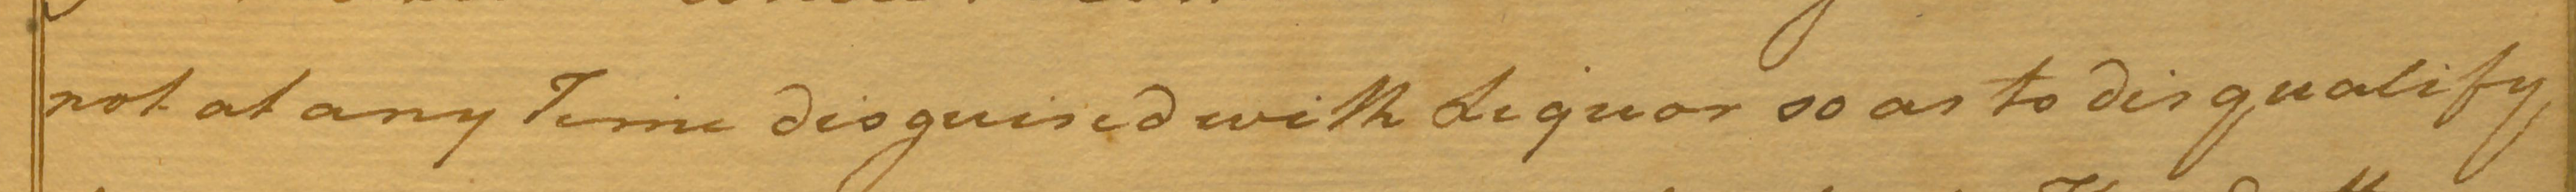not at any Time disguised with Liquor so as to disqualify
